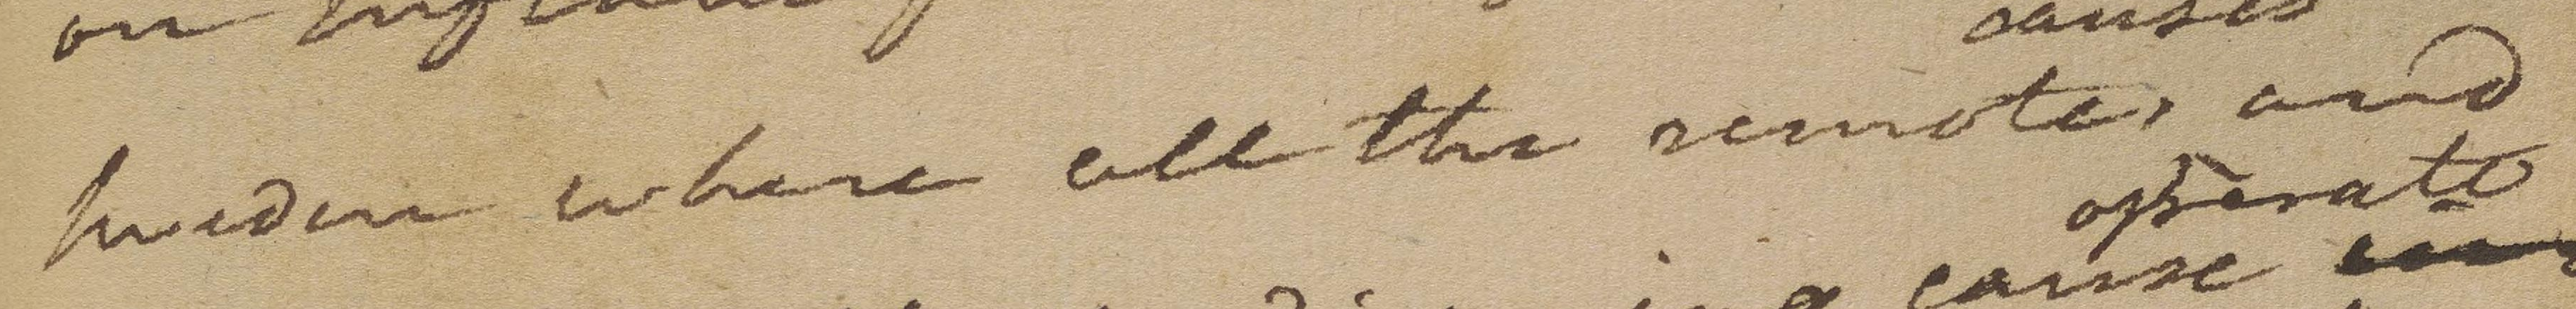Sweden where all the remote ^, and
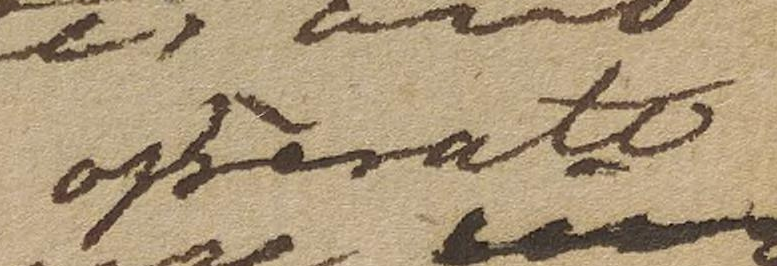operate
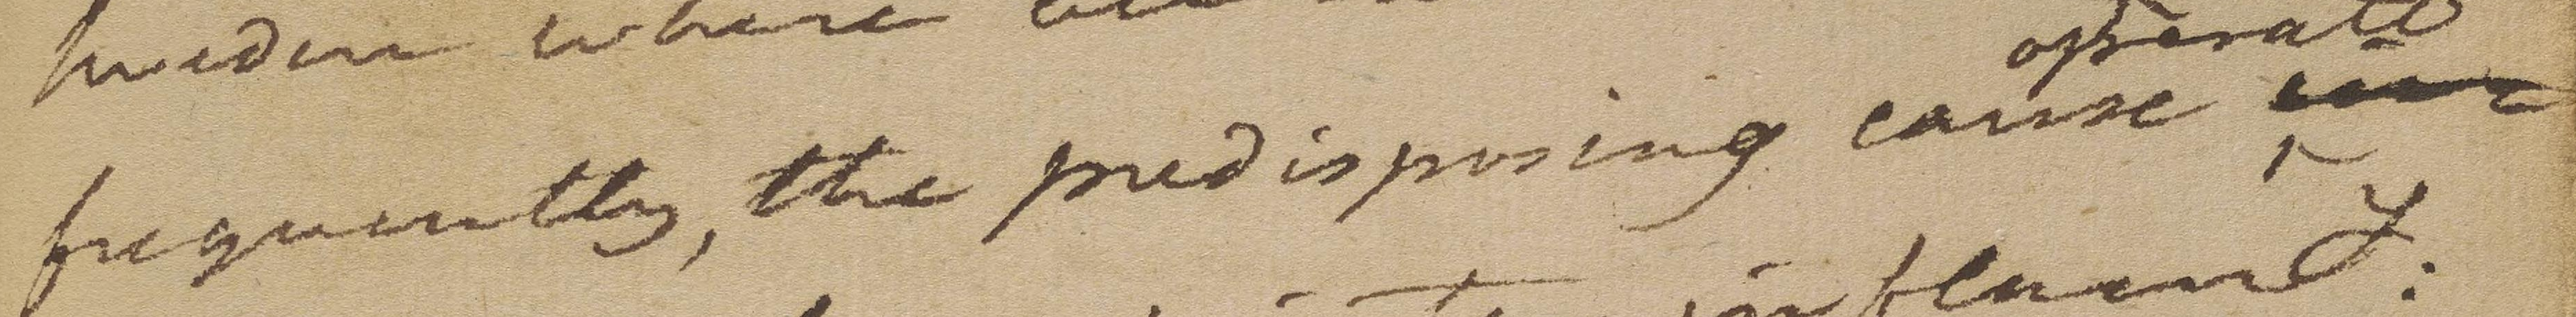frequently, the predisposing cause ^ [____]
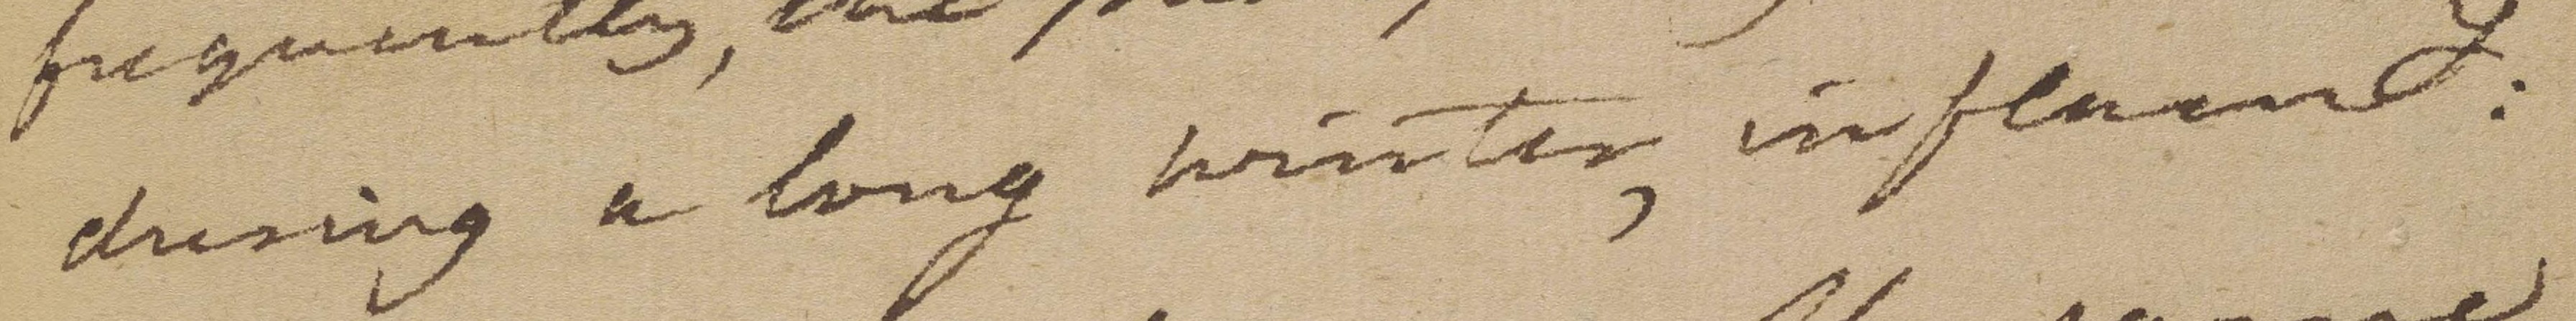during a long winter, inflam^y
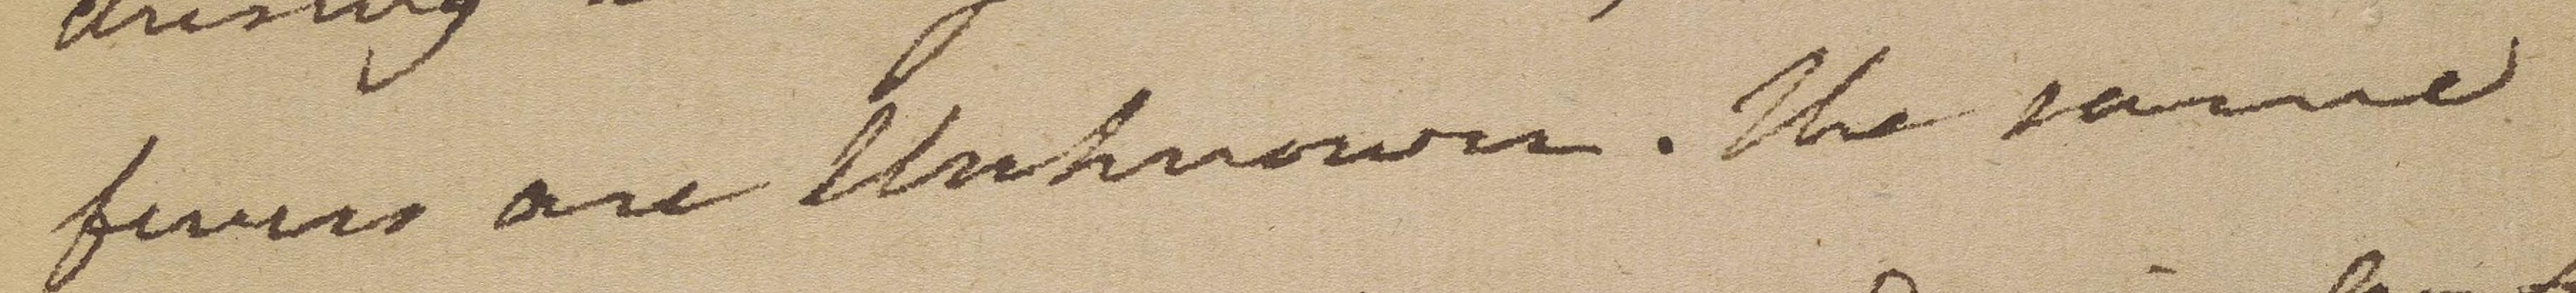fevers are Unknown. The same
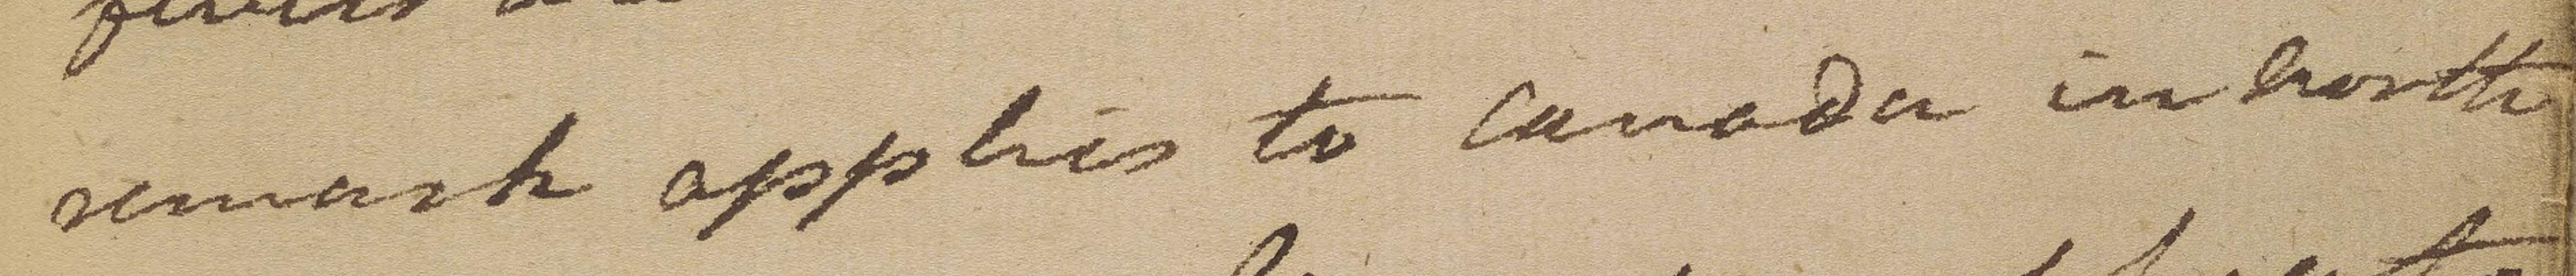remark applies to Canada in north
